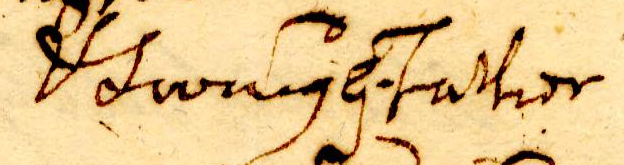& Loving Father
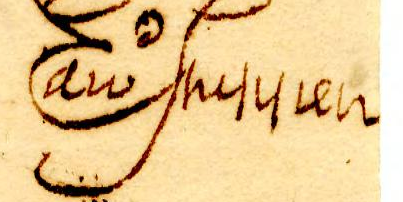Edw^d Shippen
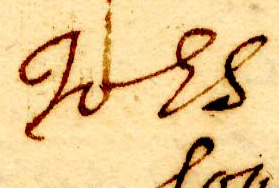To ES
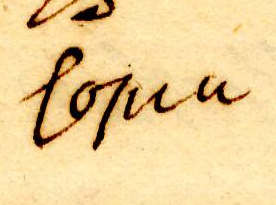Copie
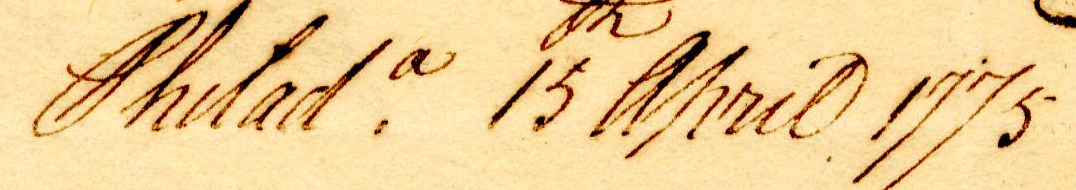Philad^a. 15 April 1775
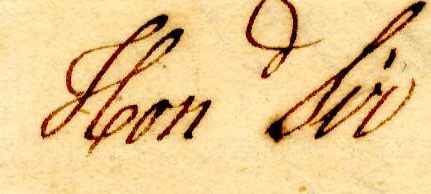Hon^d Sir
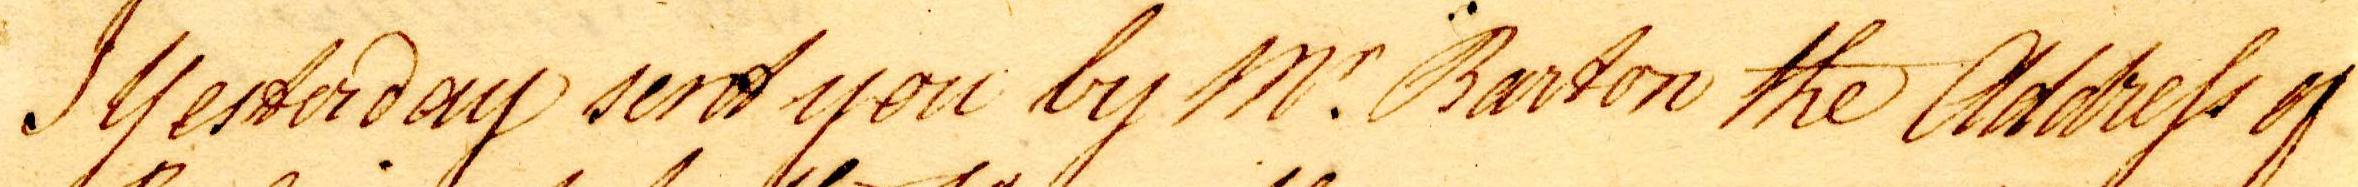I Yesterday sent you by M^r. Barton the Address of
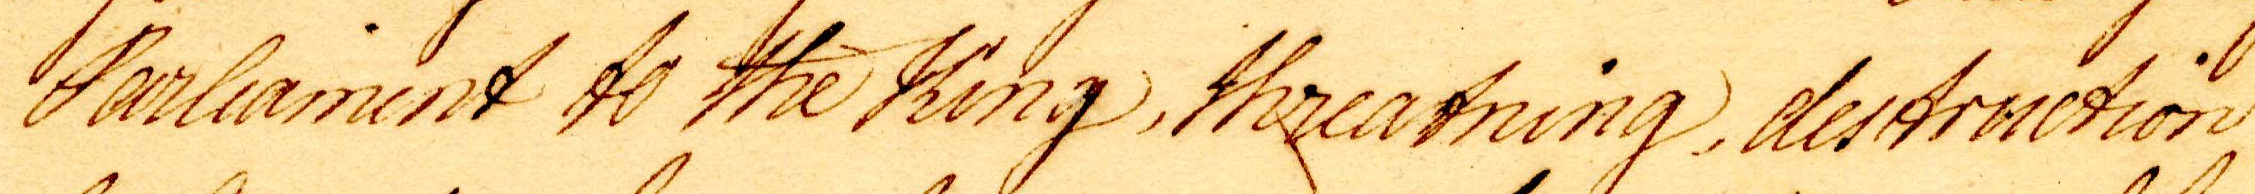Parliament to the King, threatning destruction
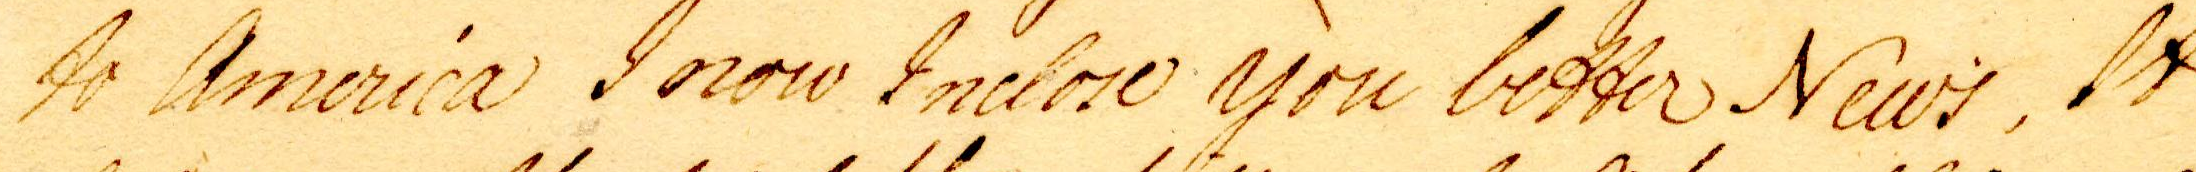to America I now Inclose you better News, It
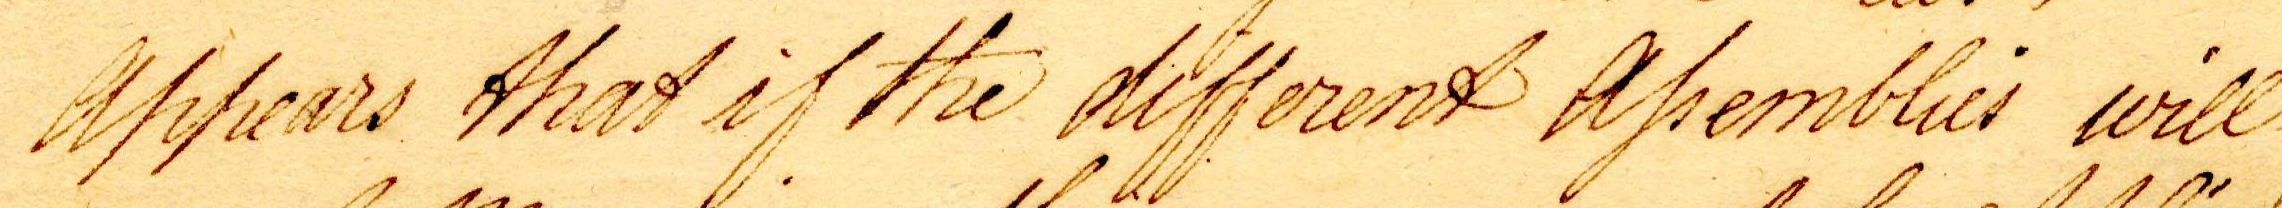Appears that if the different Assemblies will
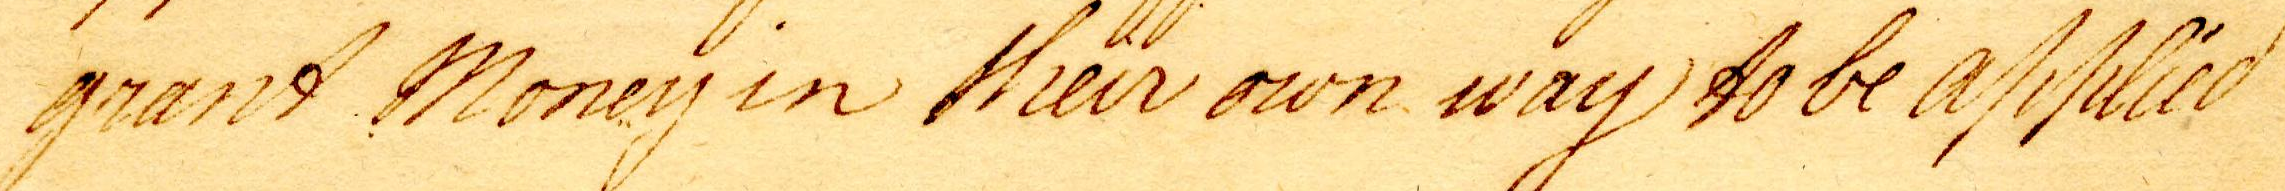grant Money in their own way to be applied
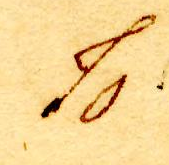To
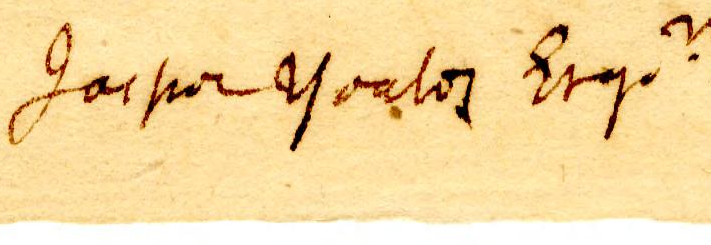Jasper Yeates Esq^r.
